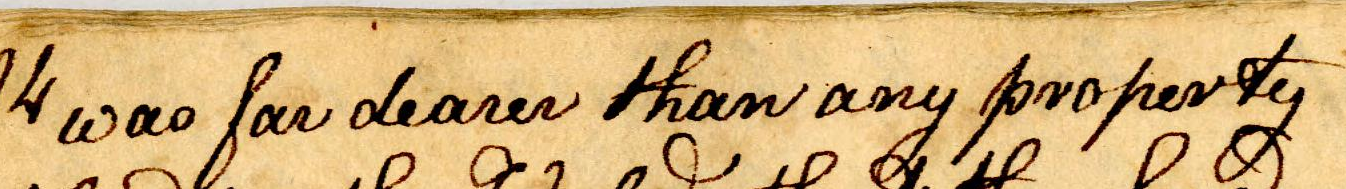was far dearer than any property
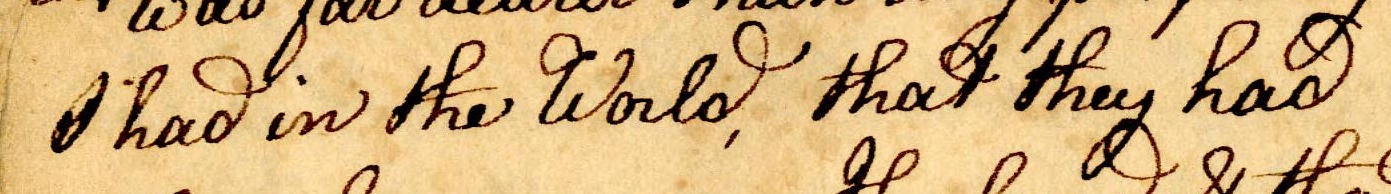I had in the World, that they had
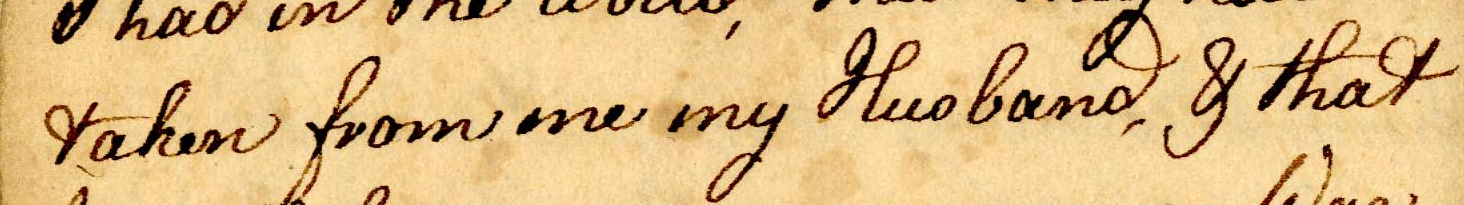taken from me my Husband, & that
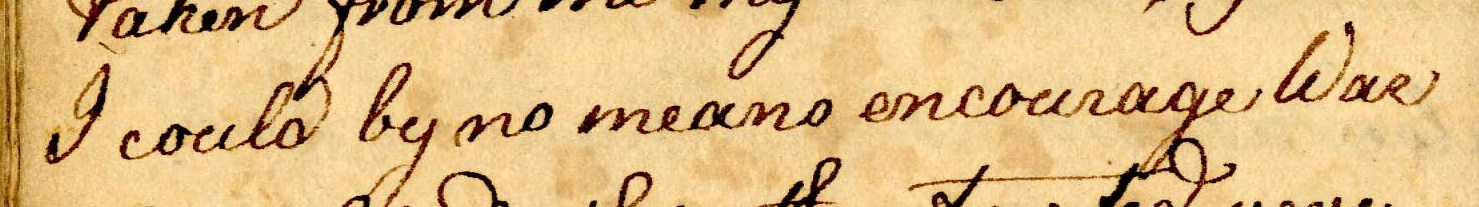I could by no means encourage War
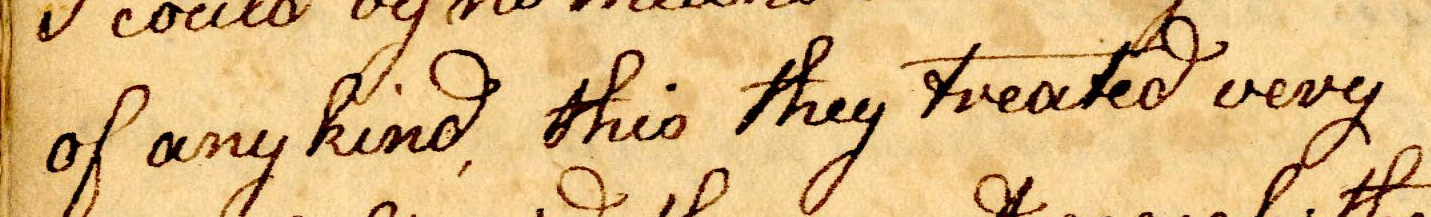of any kind, this they treated very
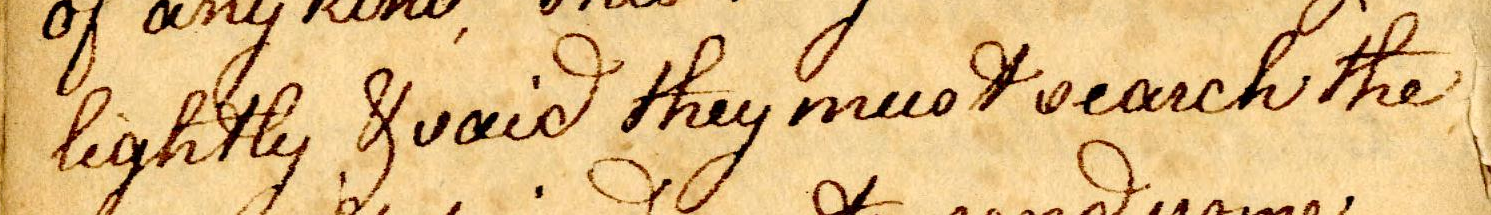lightly & said they must search the
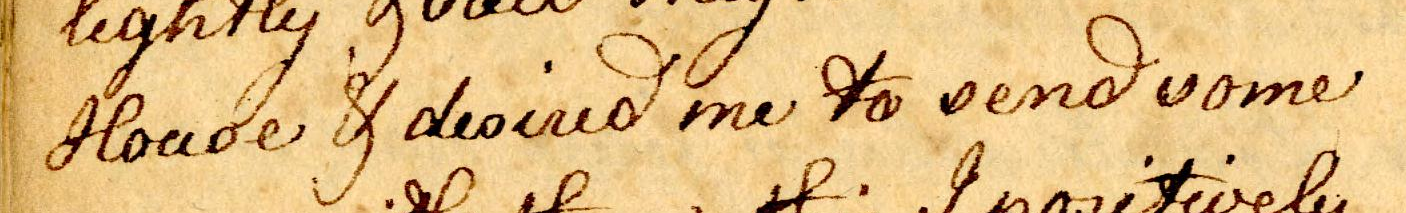House & desired me to send some
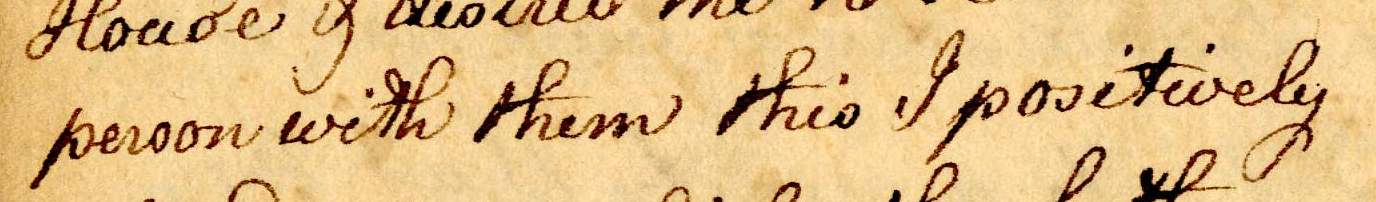person with them this I positively
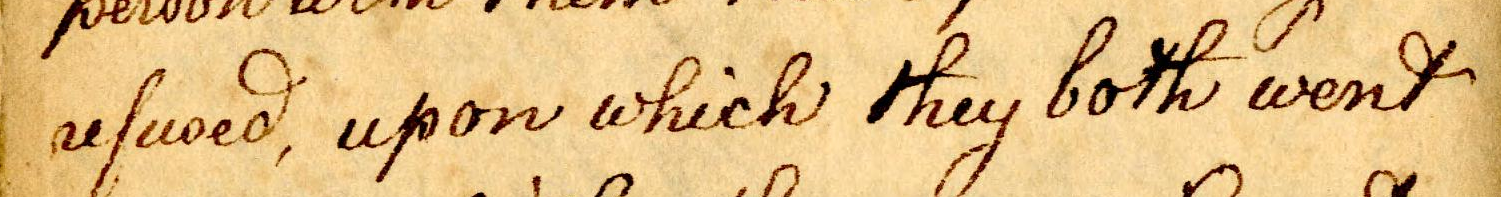refused, upon which they both went
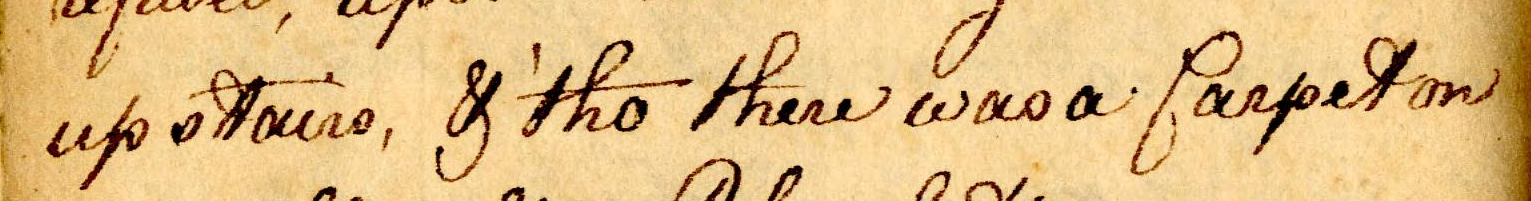up stairs, & 'tho there was a Carpet on
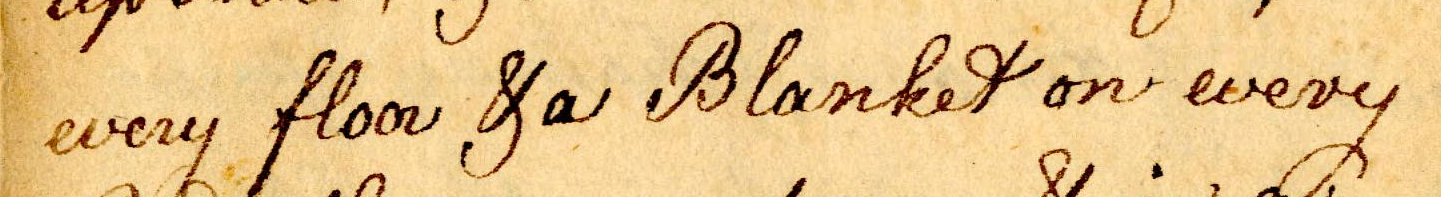every floor & a Blanket on every
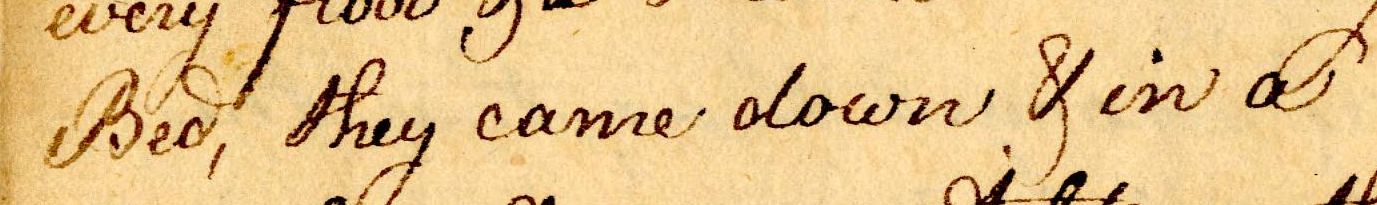Bed, they came down & in a
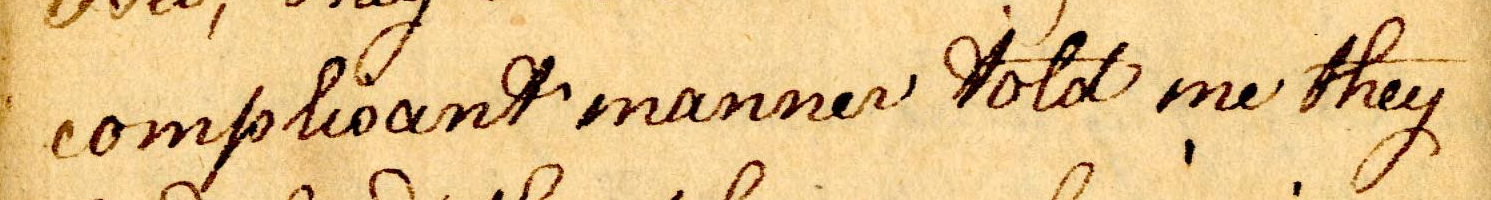complisant manner told me they
